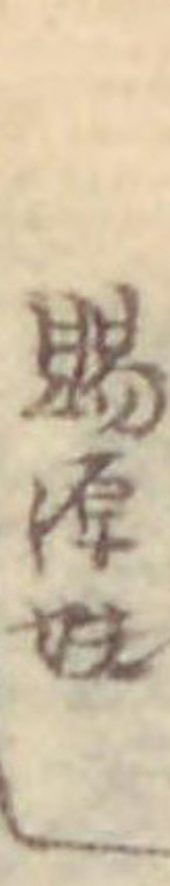賜源姓
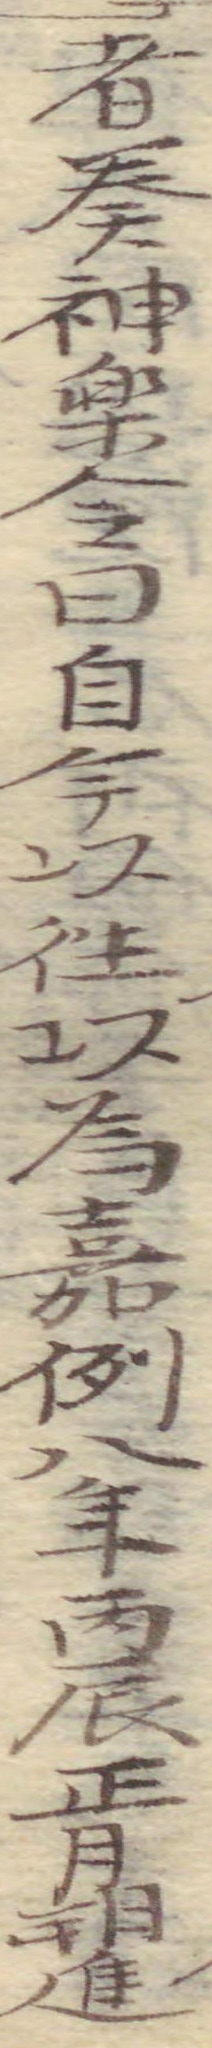者奏神楽令曰自今以徃以為嘉例八年丙辰正月朔進
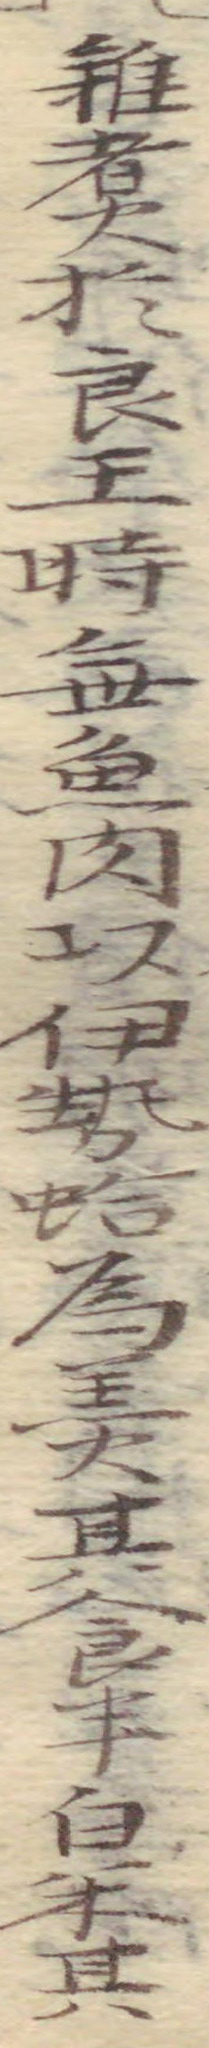雑煮於良王時毎魚肉以伊勢蛤以羹其食半白米其
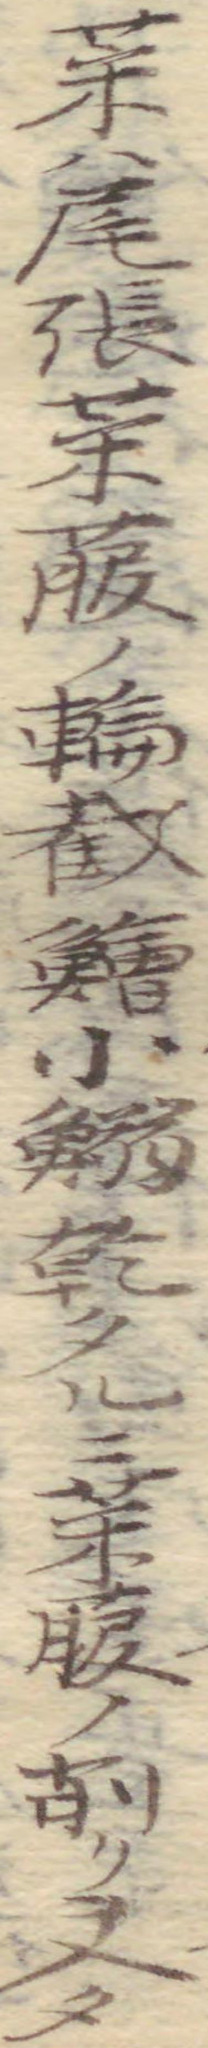菜ハ尾張菜菔ノ輪截鱠小鰯乾タルニ菜菔ノ削リヲ入タ
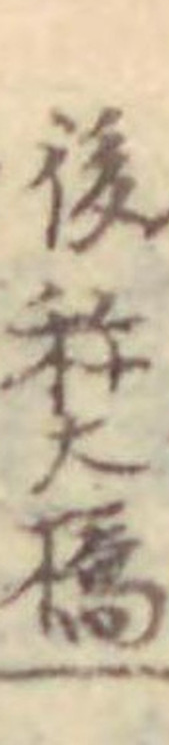後称大橋
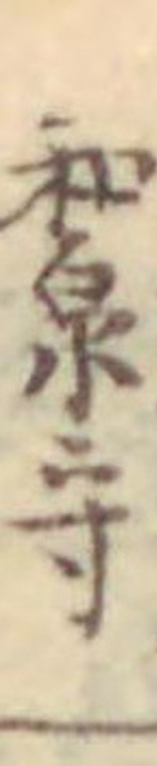和泉守
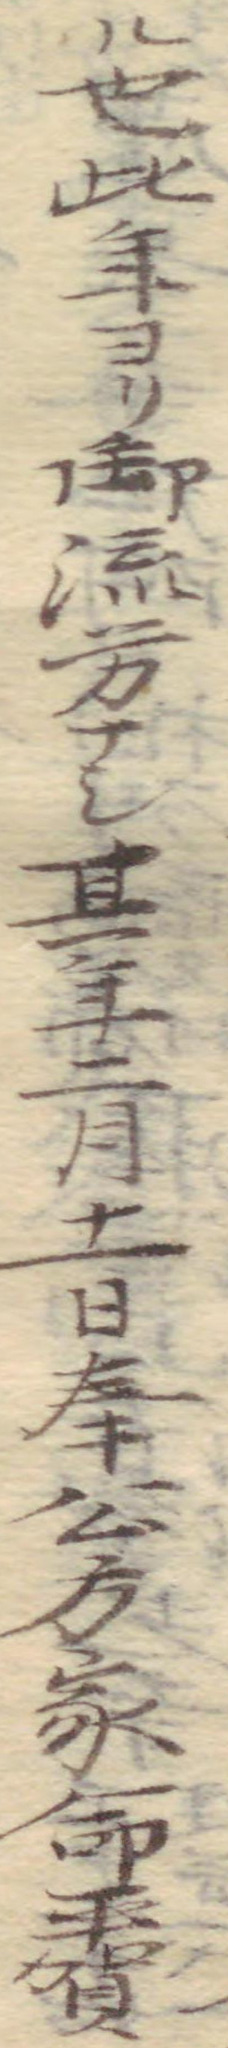ル也此年ヨリ御流労ナシ其年二月十一日奉公方家命平賀
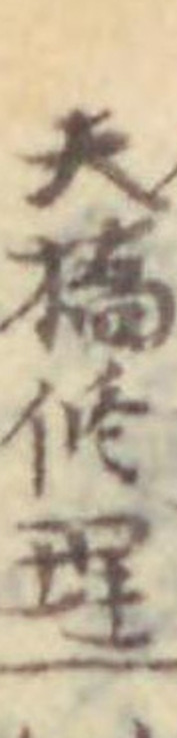大橋修理
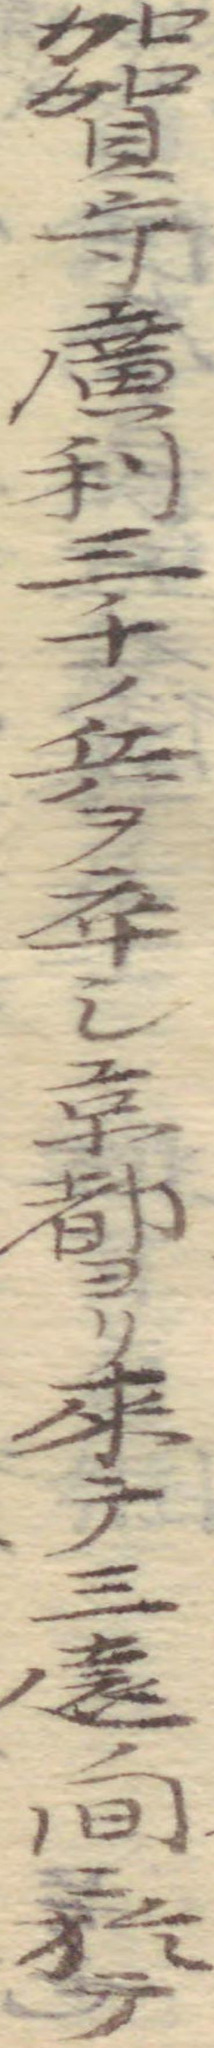加賀守広利三千ノ兵ヲ率シ京都ヨリ来テ三遠ノ間ニ於テ
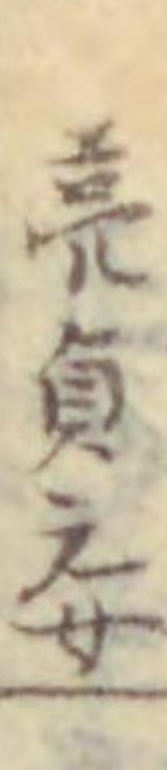亮貞之女
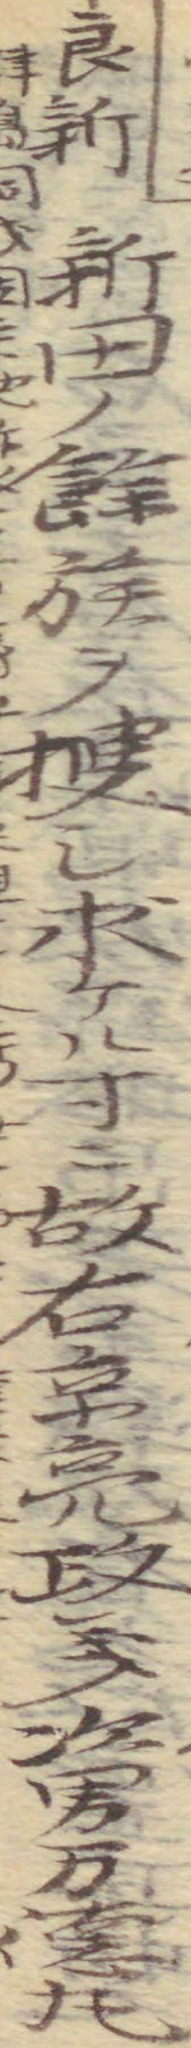新田ノ餘族ヲ捜シ求ケル寸ニ故右京亮政義次男万徳丸
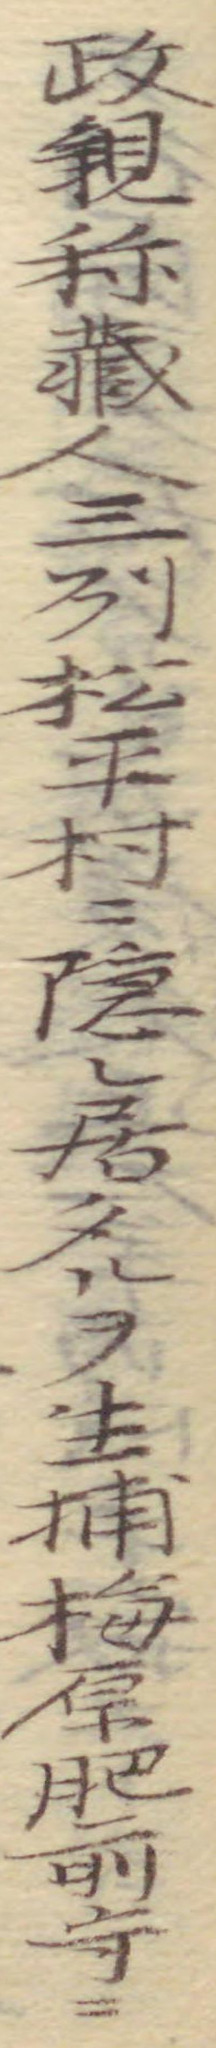政親称蔵人三州松平村ニ隠レ居タルヲ生捕梅原肥前守ニ
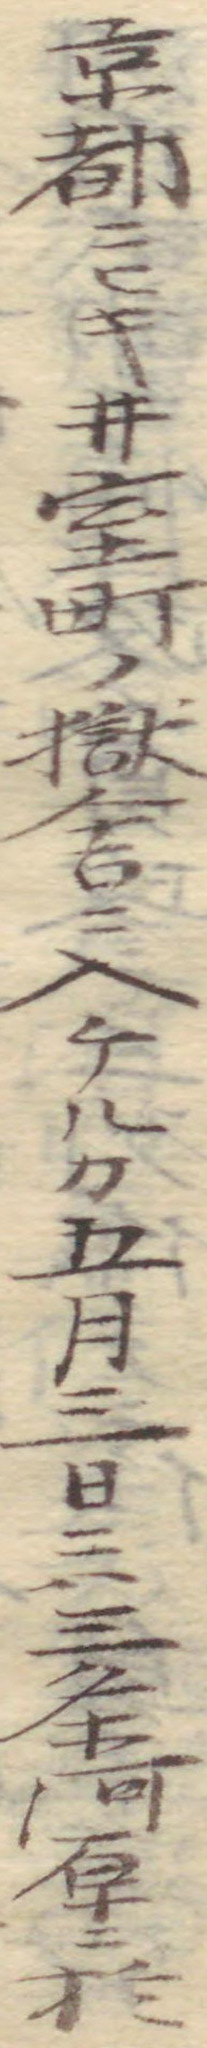京都ニヒキ井室町ノ獄舎ニ入ケルカ五月三日ニハ三条河原ニ於
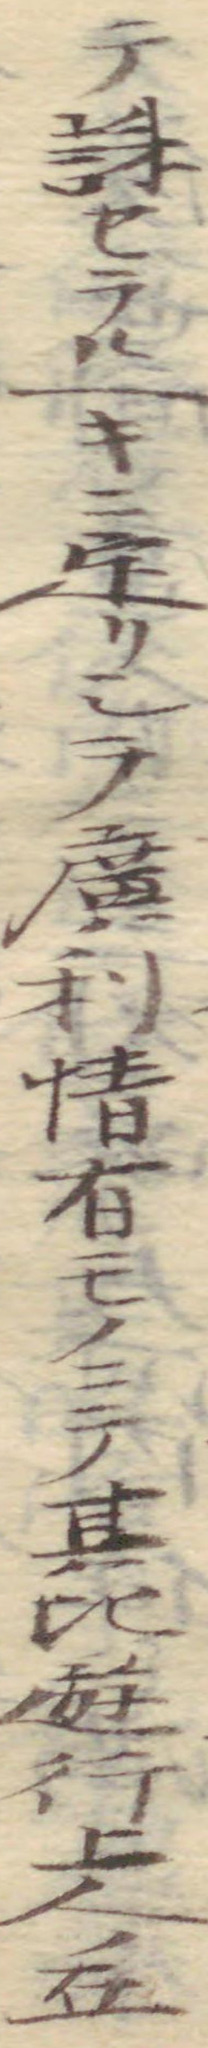テ誅セラルヘキニ定リシヲ広利情有モノニテ其頃遊行上人ノ在
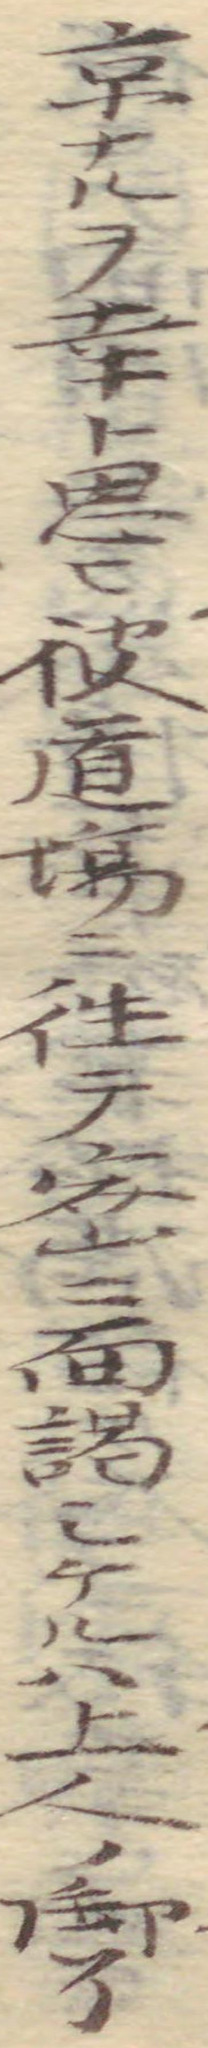京ナルヲ幸ト思ヒ彼道場ニ徃テ密ニ面謁シケルハ上人ノ御了
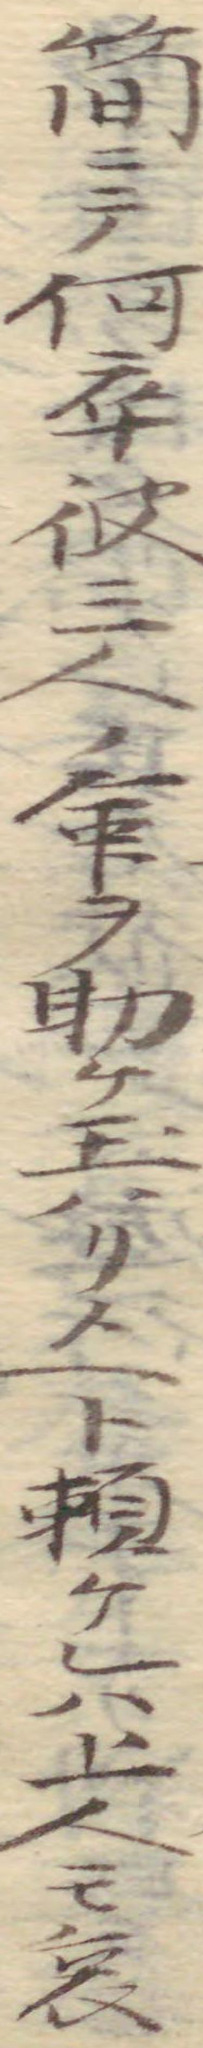簡ニテ何卒彼三人ノ命ヲ助ケ玉ハリ候ヘト頼ケレハ上人モ哀
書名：鶯宿雑記. 巻199-200
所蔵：国立国会図書館 National Diet Library, JAPAN
